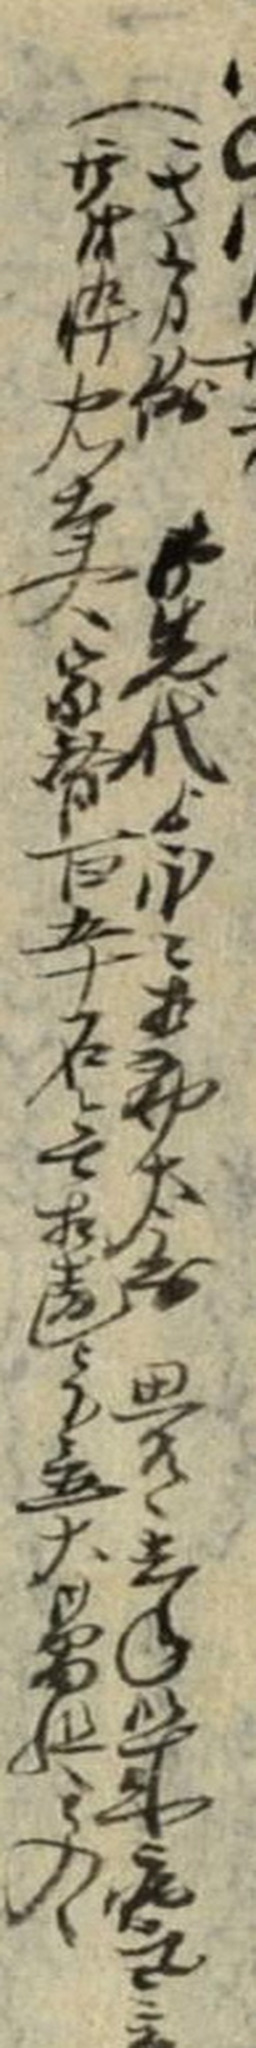仰付忰忠太夫へ家督百五十石無相違被下置大御番組へ被入候
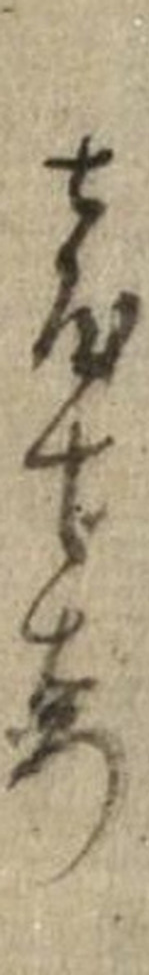土屋十郎右衛門
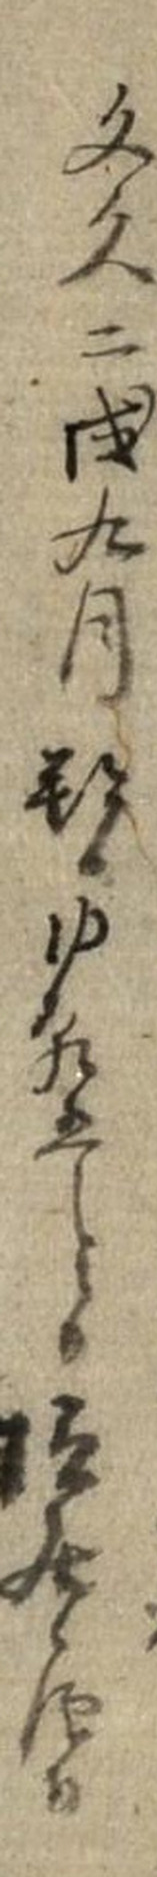文久二戌九月朔日内願有之に付隠居被仰付
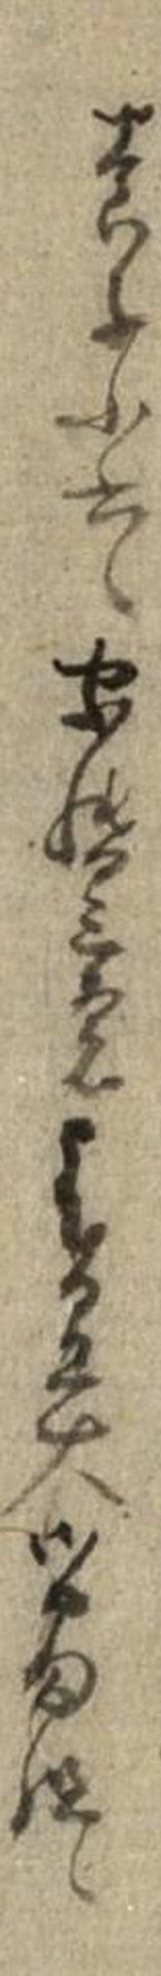養子小六へ家督三百石被下置大御番組ヘ
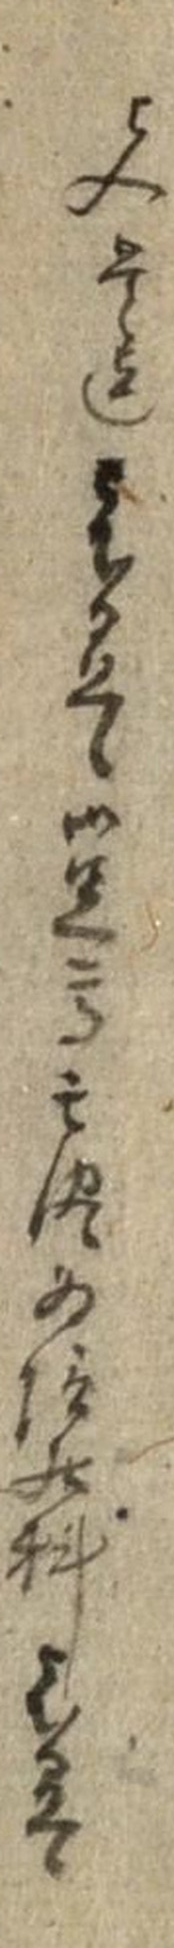被入是迄被下置候御足高其儘為隠居料被下置候

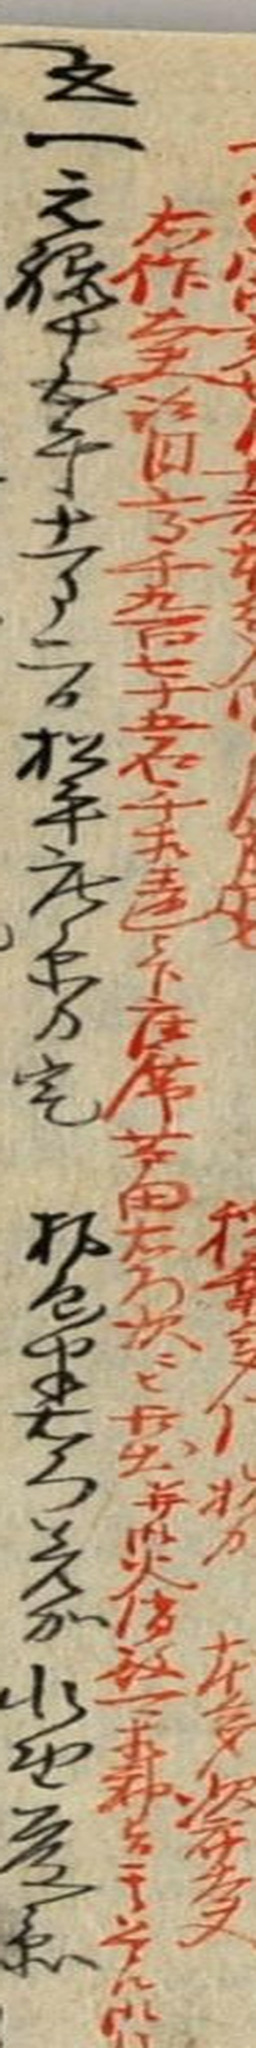一元禄十五午十一月二日松平庄兵衛方宅栃屋半右衛門差加水野藤兵衛
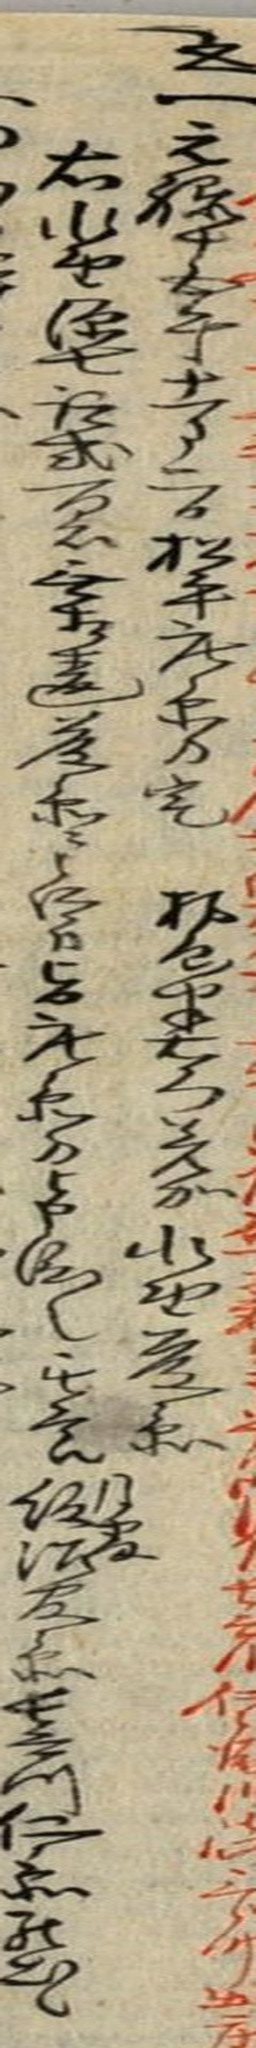右水野源七跡式百石無相違藤兵衛に被仰付候旨庄兵衛方被申渡之其節月番飯沼官兵衛長谷川伝兵衛罷出候
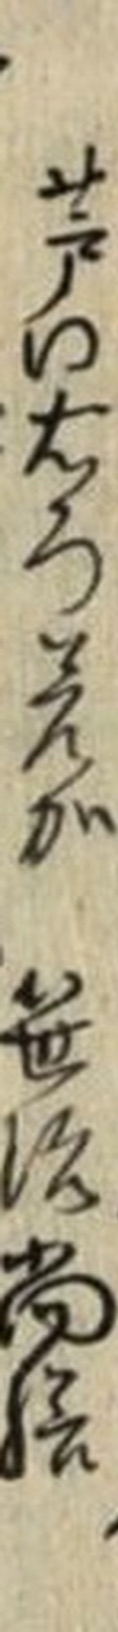芦田左衛門差加笹治権四郎
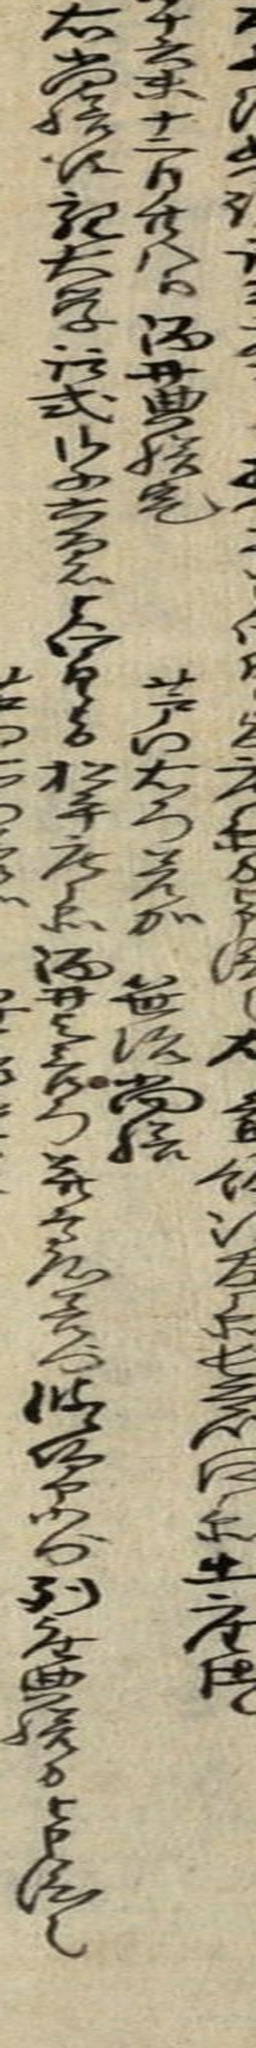右尚膳儀親大学跡式弐千六百石被仰付候旨松平庄兵衛酒井与三左衛門并高屋善右衛門波々伯部小右衛門列座典膳方被申渡之
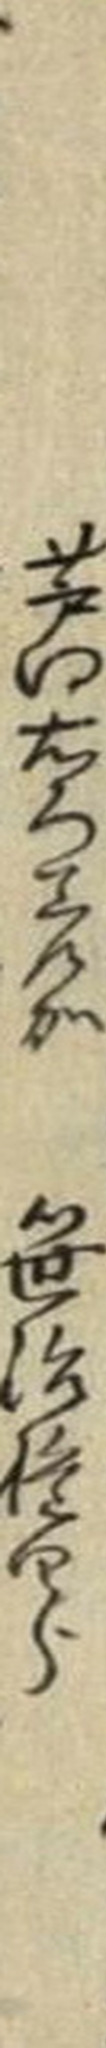芦田左衛門差加笹治権四郎
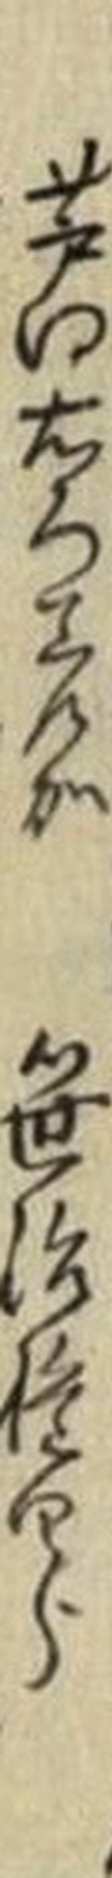芦田左衛門差加笹治権四郎
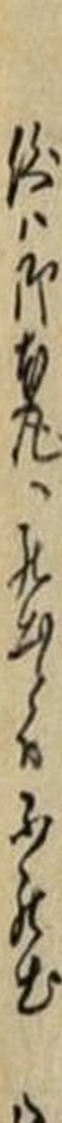儀は御本丸へ罷出候に付不罷出
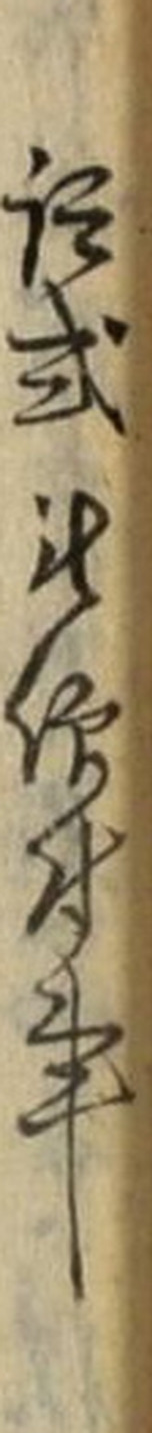跡式被仰付事
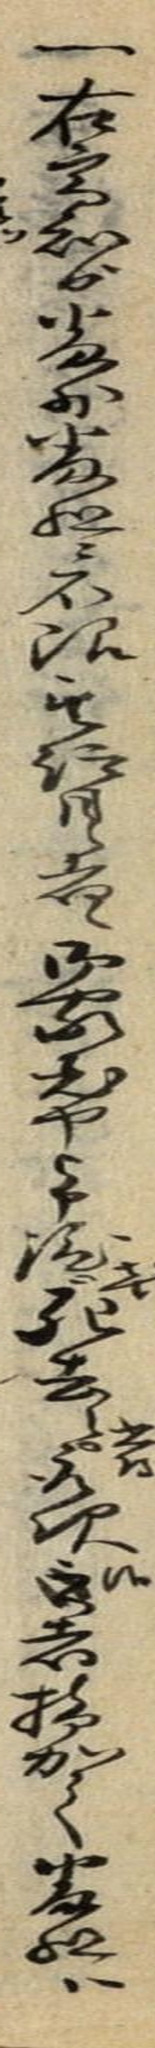一右高知ゟ番外番組に不限其跡目之者へ御家老中被申渡并死去之書付け取次候者指加之番組は
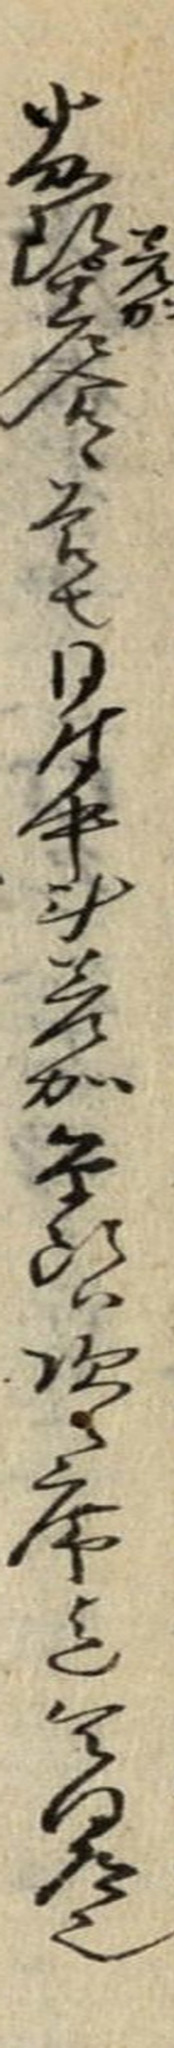番頭差加差合候節は目付中斗差加筆頭は次之席迄令同道也
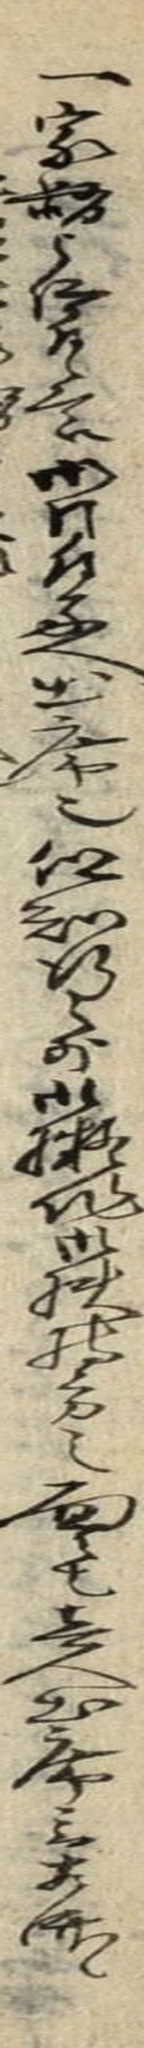一家督被仰付候節御目付両人出席也但知行之外御擬作御扶持方之面々は壱人出席に而相済候
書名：御用并被仰出之部
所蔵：福井県文書館 Fukui Prefectural Archives
